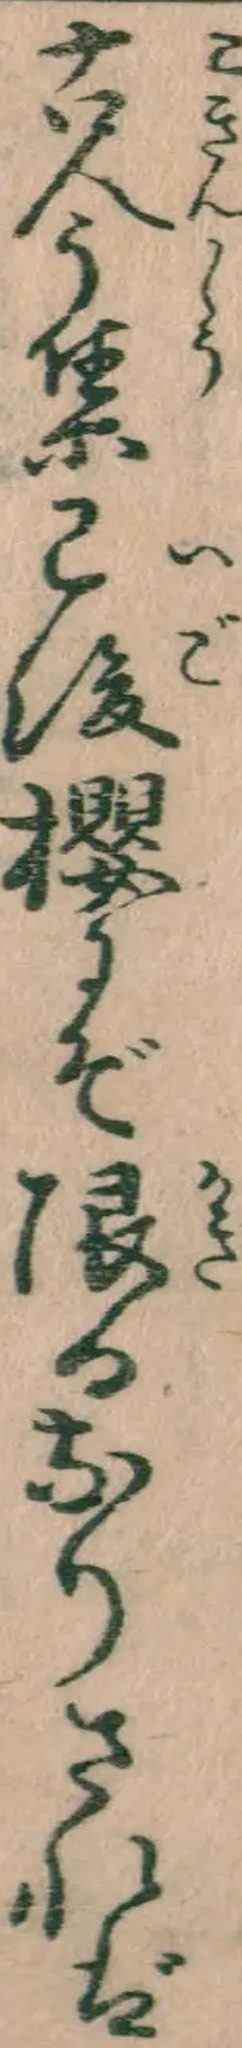古今集已後桜にぞ限るなりされば
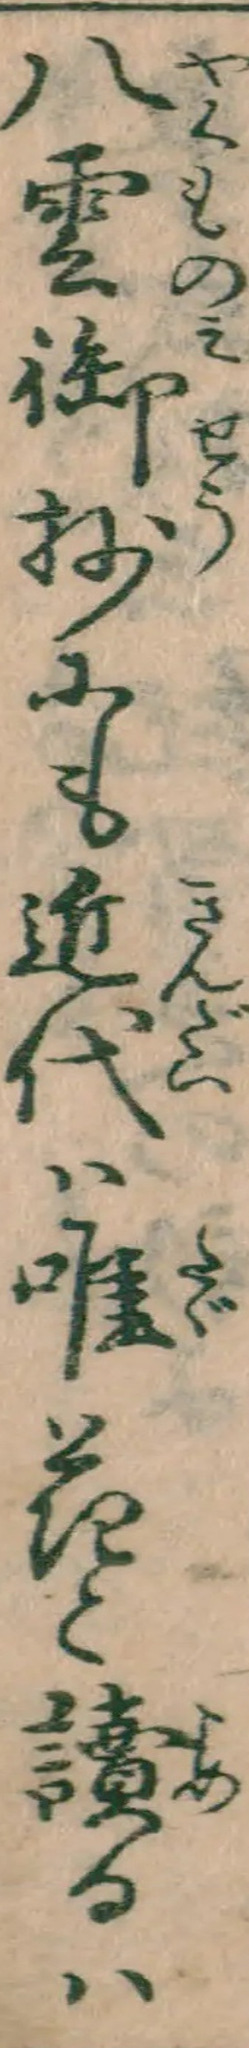八雲御抄にも近代は唯花と読るは
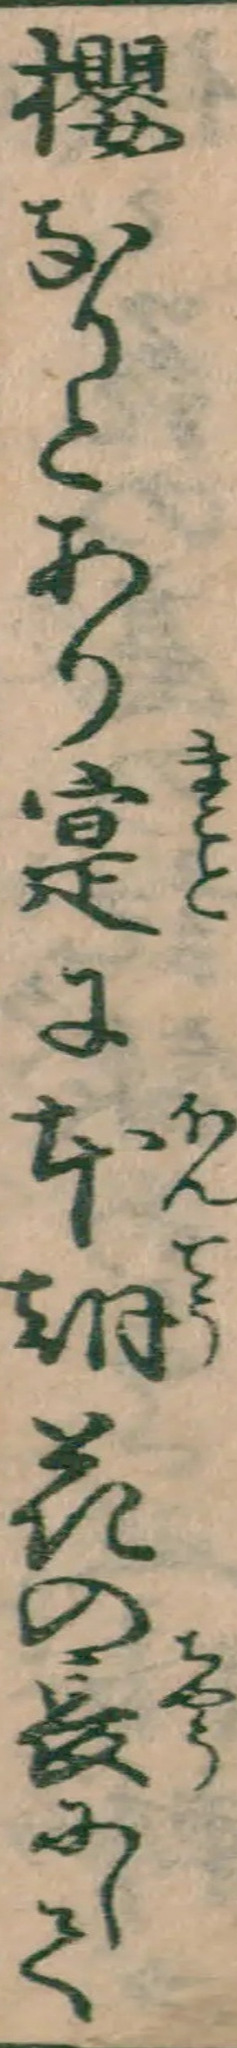桜なりとあり寔に本朝花の長にして

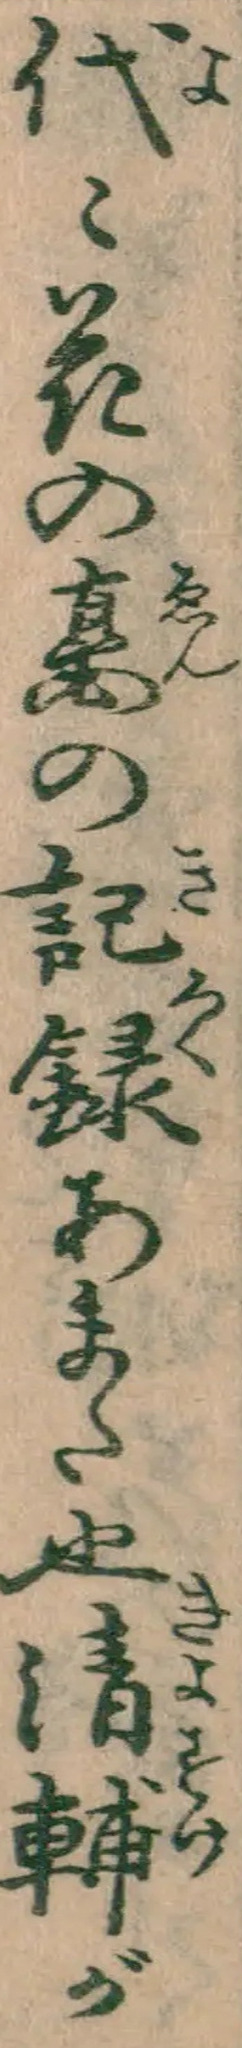代々花の宴の記錄あまた也清輔が
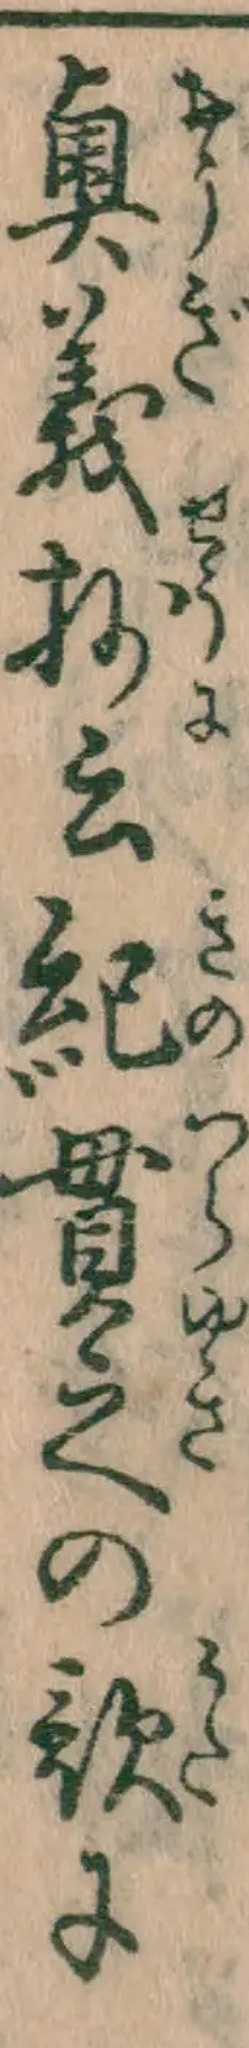奥義抄云紀貫之の歌に
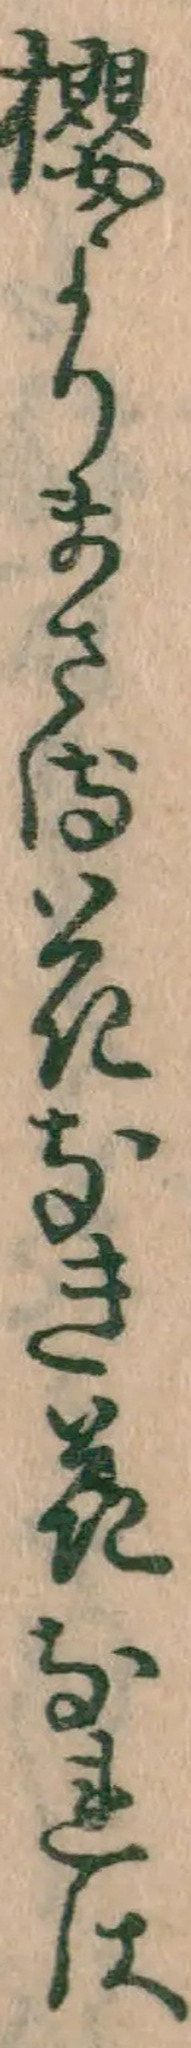桜よりまさる花なき花なれは
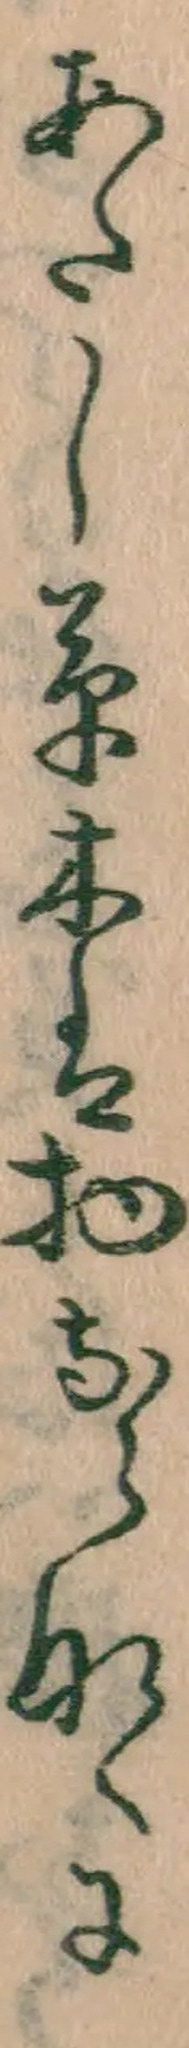あたし草木は物ならなくに
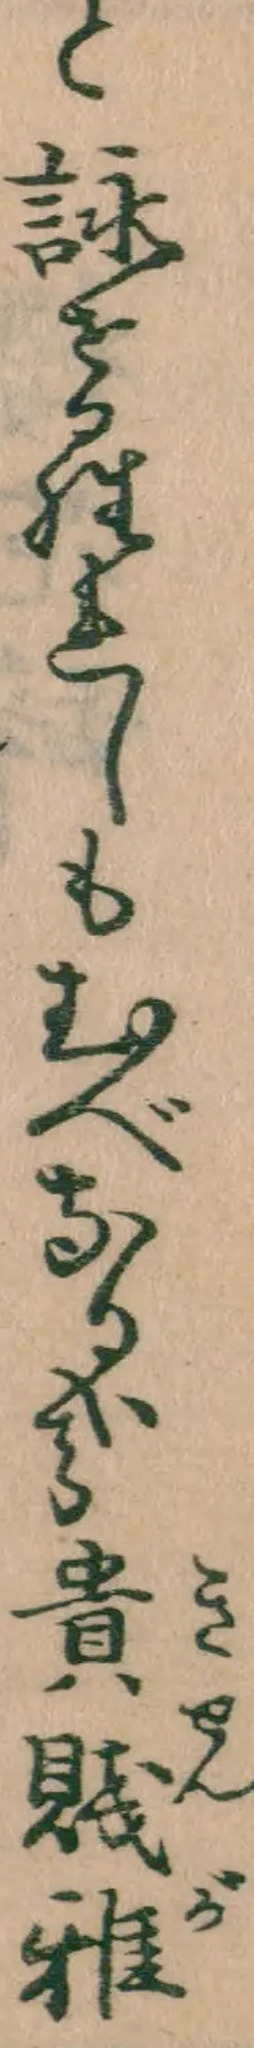と詠せる程れしもむべなる哉貴賤雅
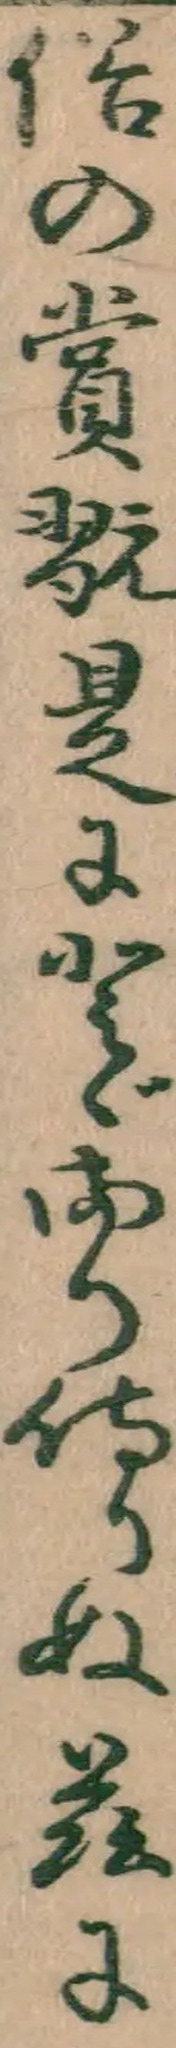俗の賞翫是にとゞまり侍りぬ兹に
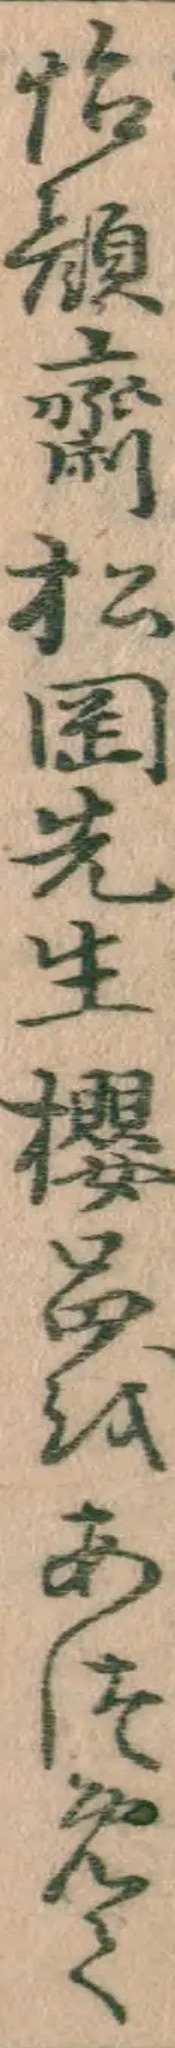怡顔斎松岡先生桜品をあつめて
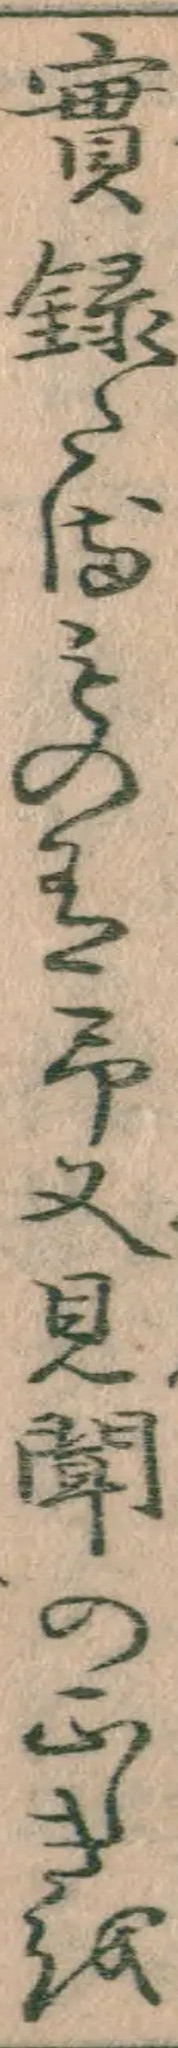実録たるもの有予又見聞の正しきを
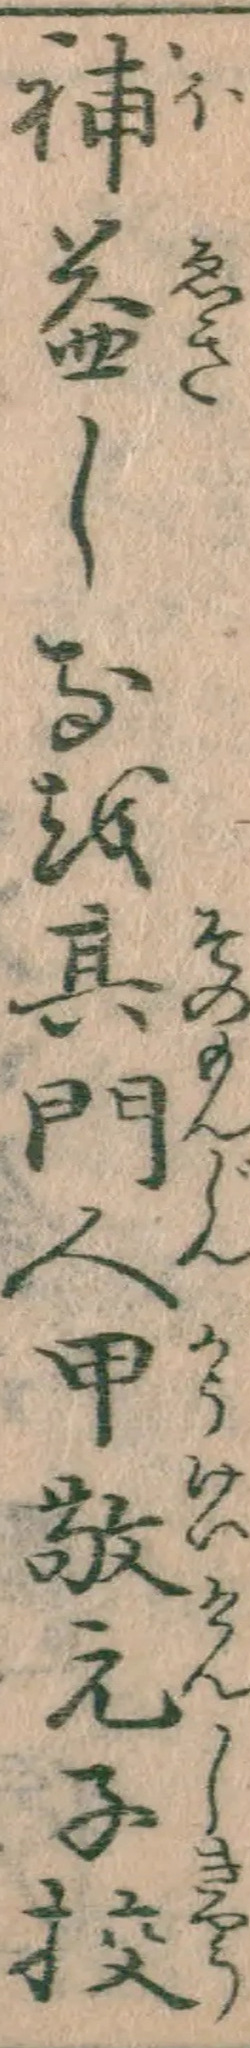補益し事を其門人甲敬元子挍
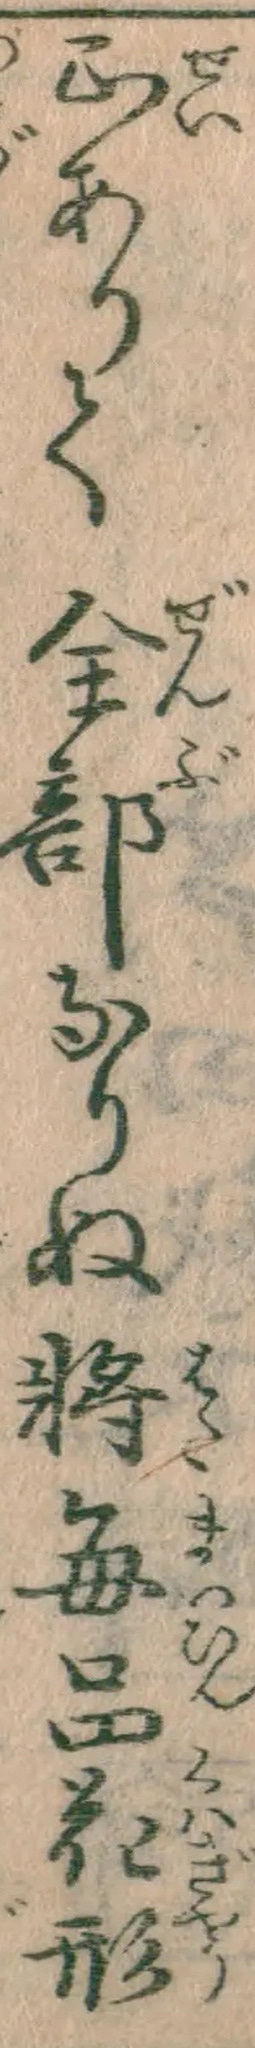正ありて全部なりぬ将毎品花形
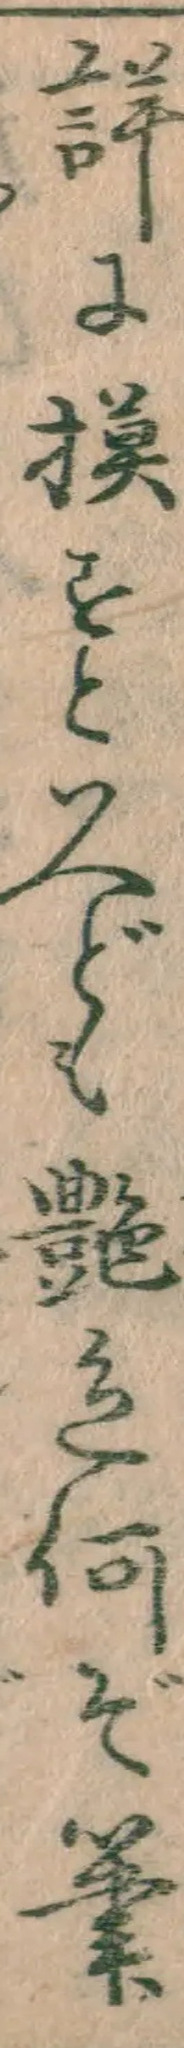詳に摸すといへども艶色何ぞ筆
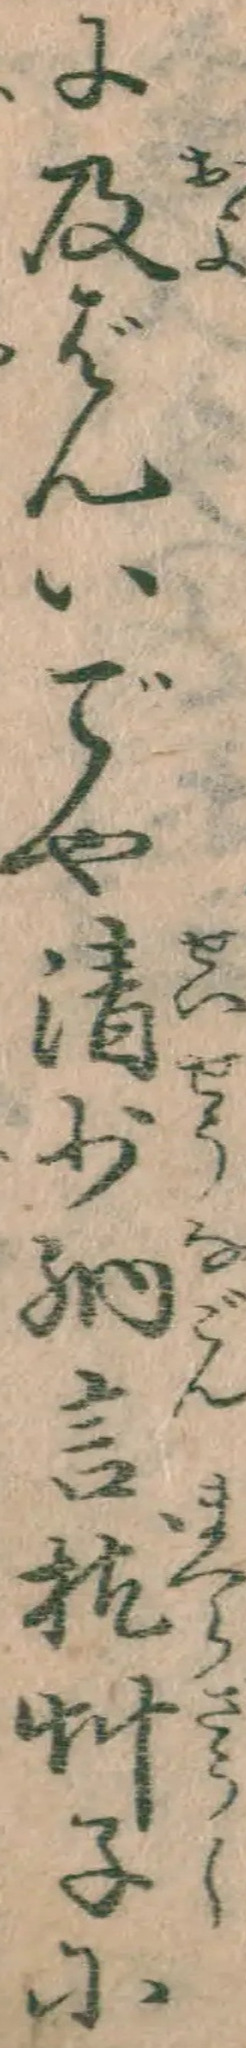に及ばんいでや清少納言枕艸子に
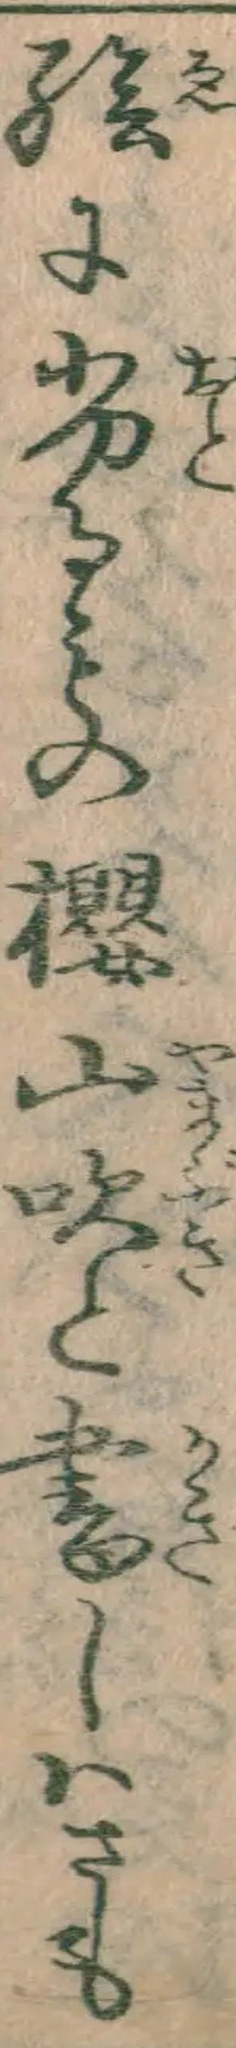絵に劣るもの桜山吹と書しはさも
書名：怡顔齋櫻品
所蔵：国立国会図書館 National Diet Library, JAPAN
